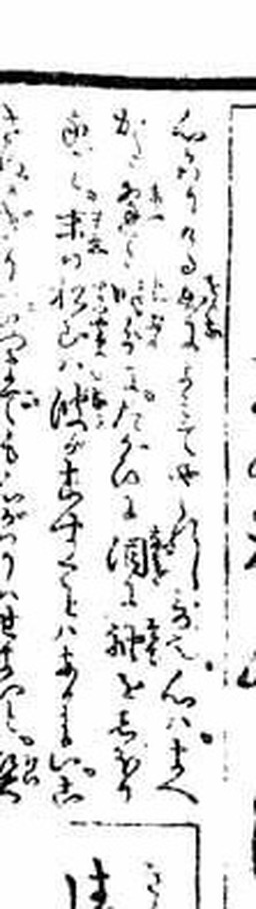かた逢た時分にたがひに泪に袖をしほり清
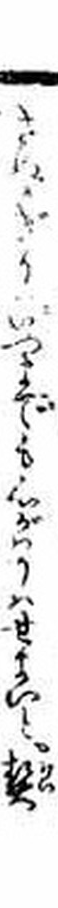さぬかぎりいつまでも心がはりせまいと契原
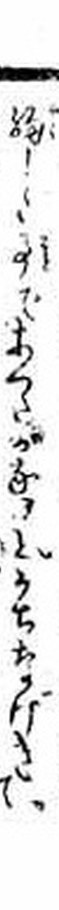約した事であつたがなをとうちなげきて
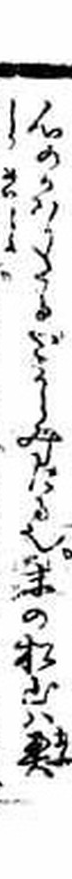心のかはりたるをうらみたるなり末の松山は奥
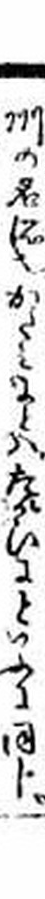州の名所也かたみにとはたがひにといふるに同じ
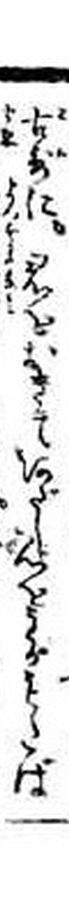古哥に君をおきてあだし心をわがもたば
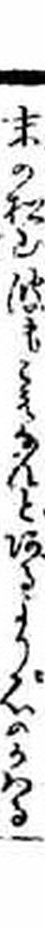末の松山波もこえなんとあるより心のかはる元
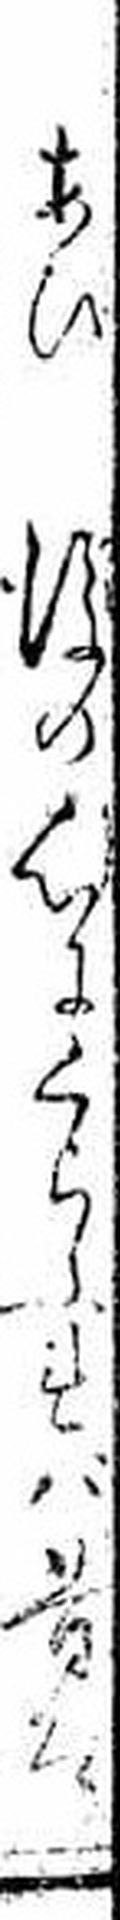あひ後の心にくらぶれば昔は
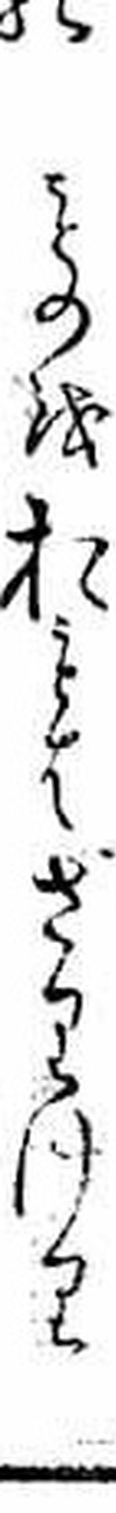のものをおもはざりけり
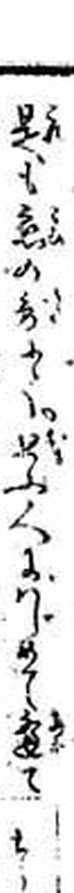是も恋の哥にて思ふ人にはじめて逢て
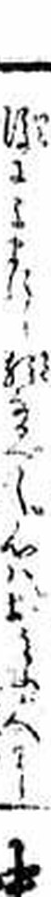後によまれし歌なるべし心はおもふは人に中納
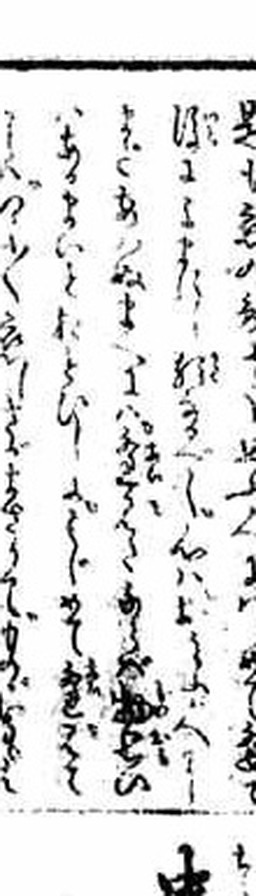まだあはぬまへには逢見たんらば物思ひ
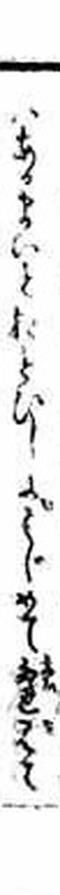はあるまいとおもひしにはじめて逢見て言
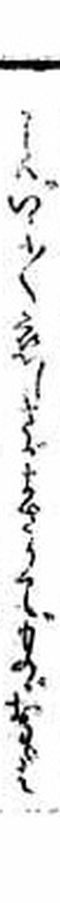からはいよ〳〵恋しさがまさりてものおもは
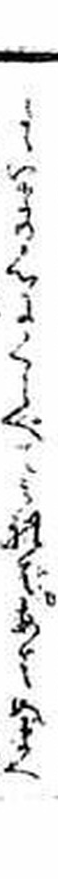るゝいまのこころにくらべてみればあはぬまへ
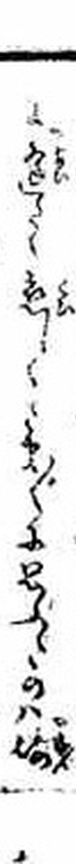に逢たく恋しくこま〴〵に思ふたのは
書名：小倉百人一首
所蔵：東京学芸大学教育コンテンツアーカイブ
